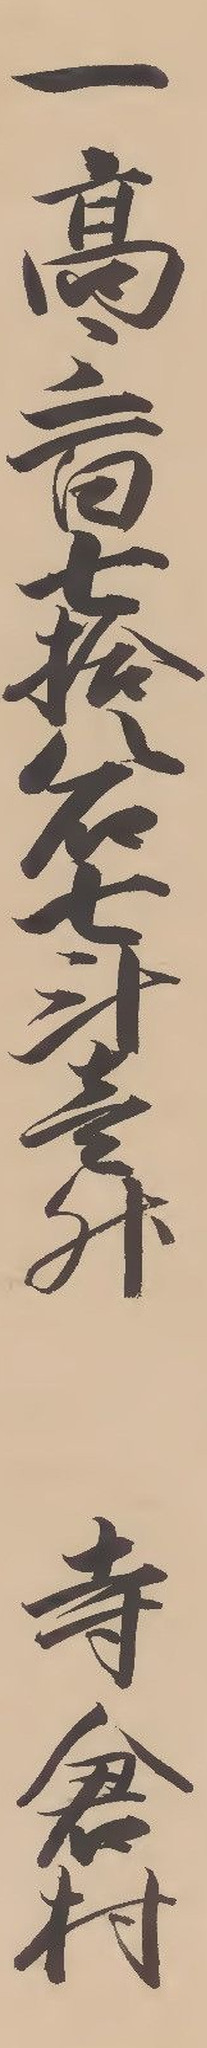一高三百七拾八石七斗壱升寺倉村
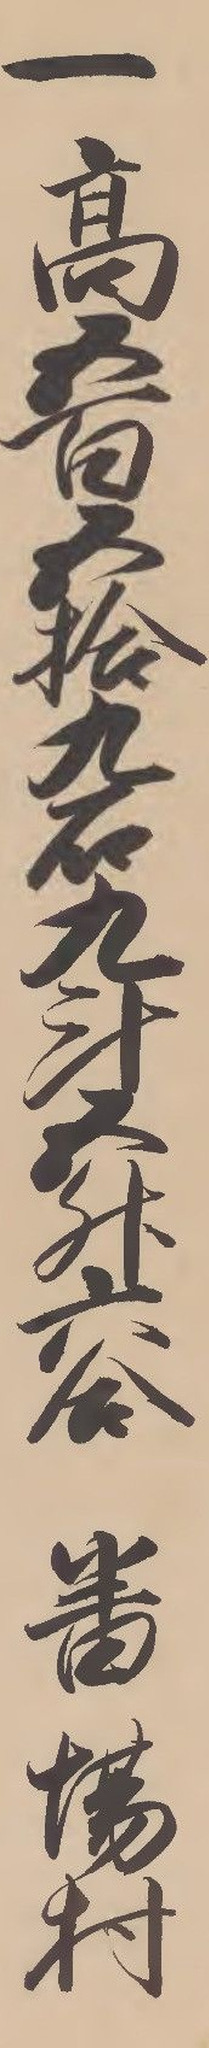一高五百五拾九石九斗五升六合番場村
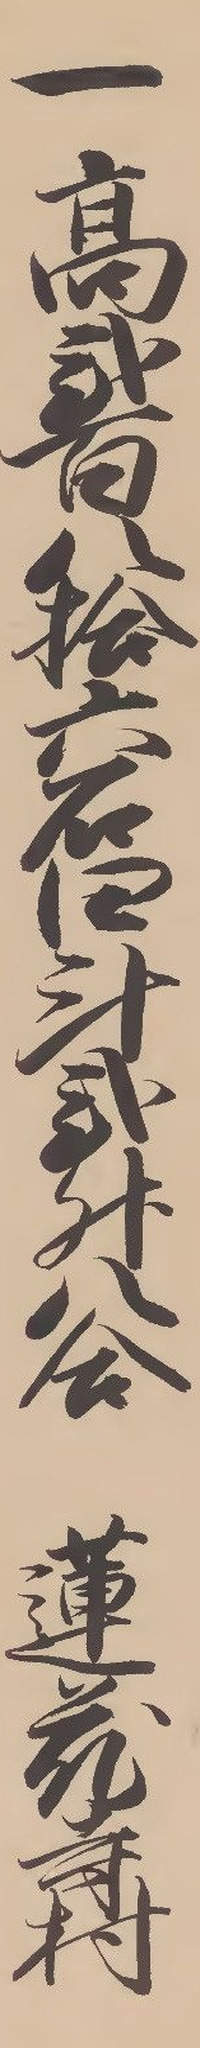一高弐百八拾六石四斗弐升八合蓮花寺村
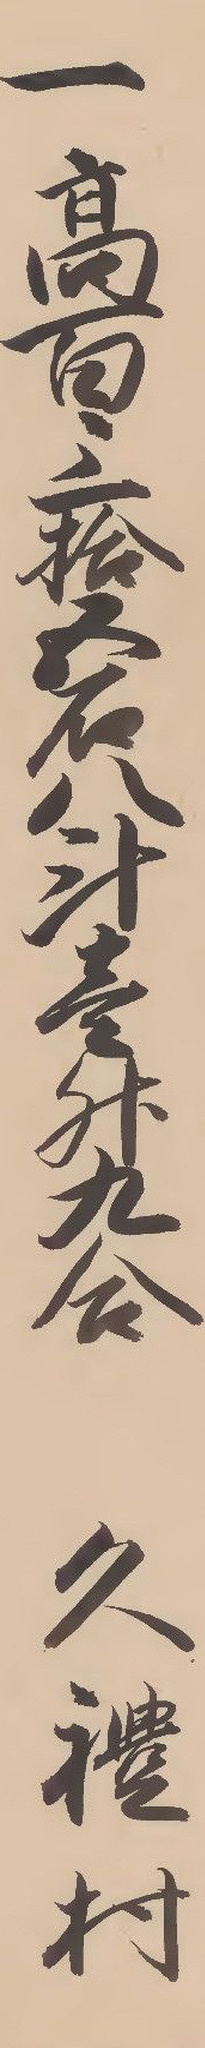一高百三拾五石八斗壱升九合久礼村
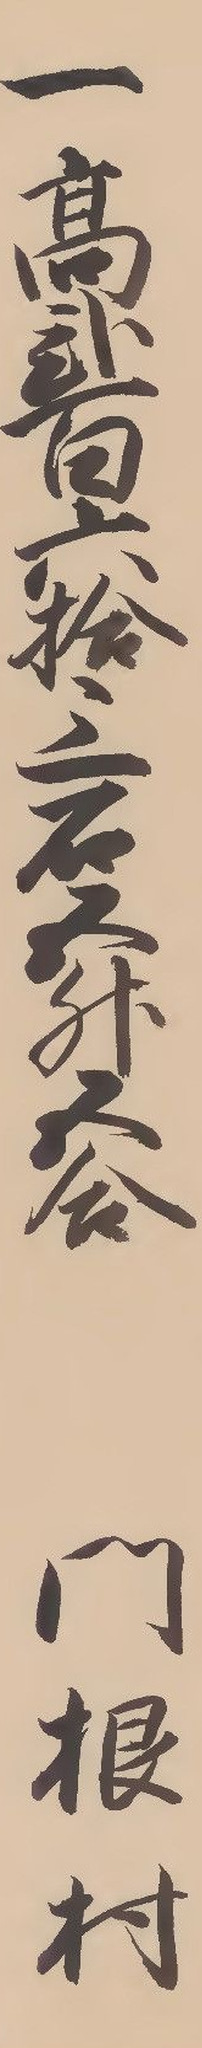一高弐百六拾三石五升五合門根村
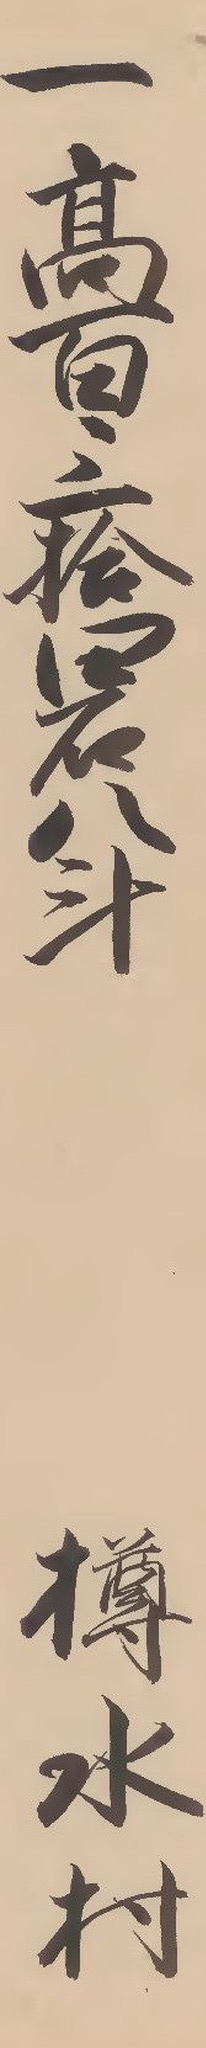一高百三拾四石八斗樽水村
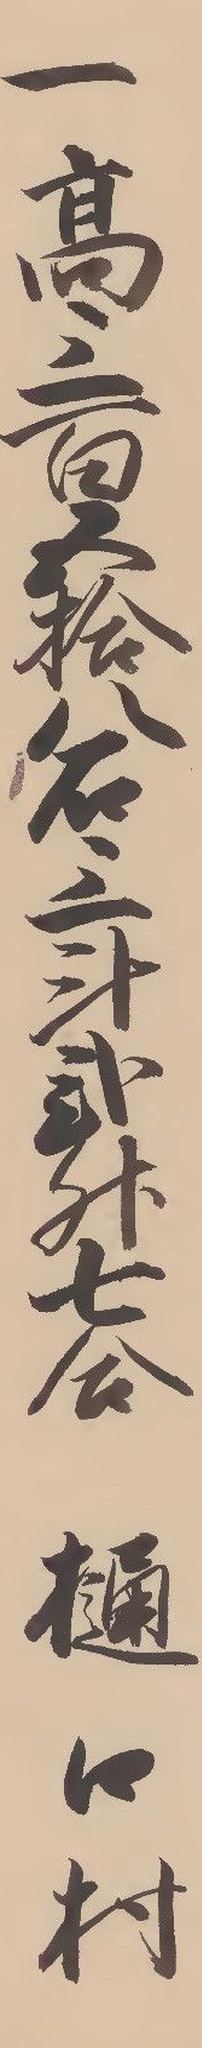一高三百五拾八石三斗弐升七合樋口村

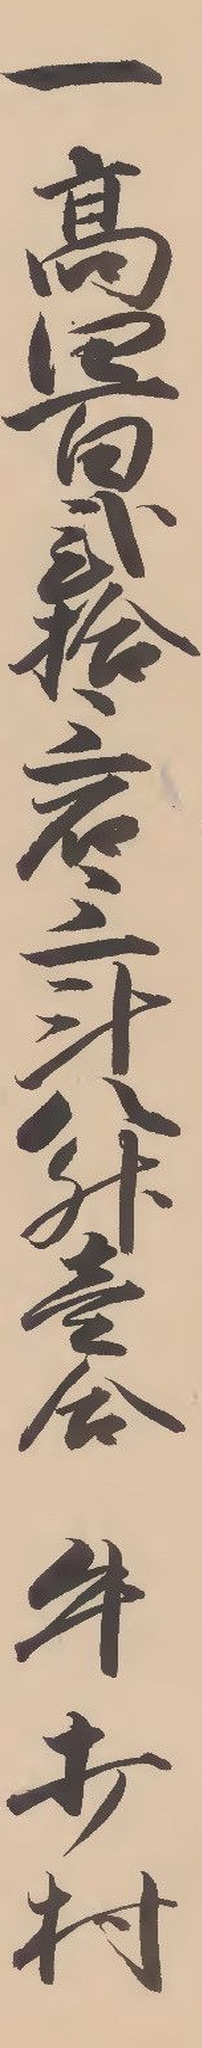一高四百弐拾三石三斗八升壱合牛打村
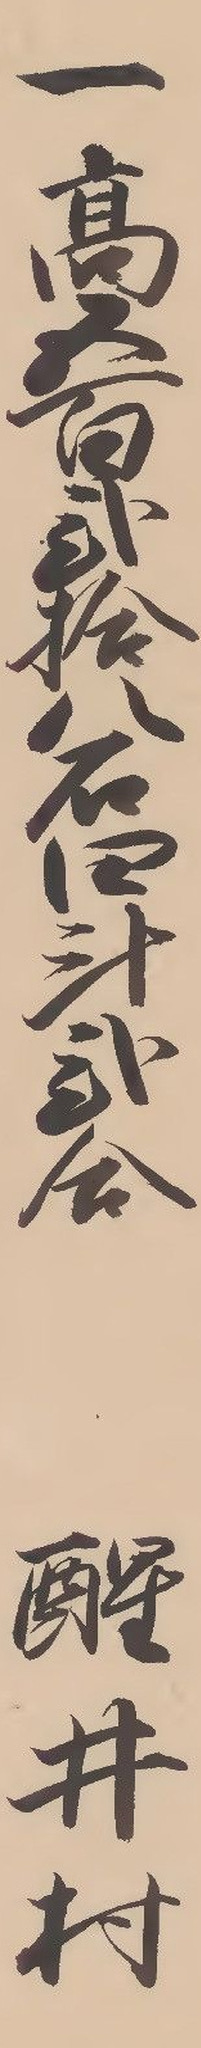一高五百弐拾八石四斗弐合醒井村
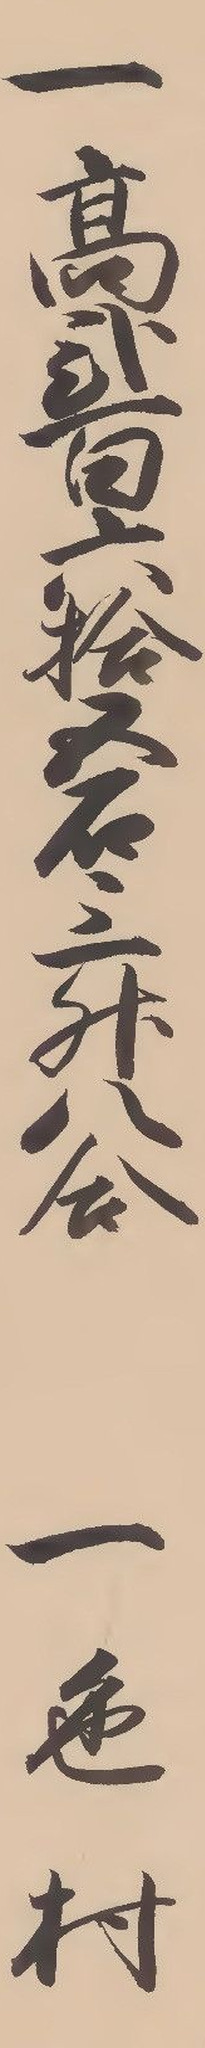一高弐百六拾五石三升八合一色村
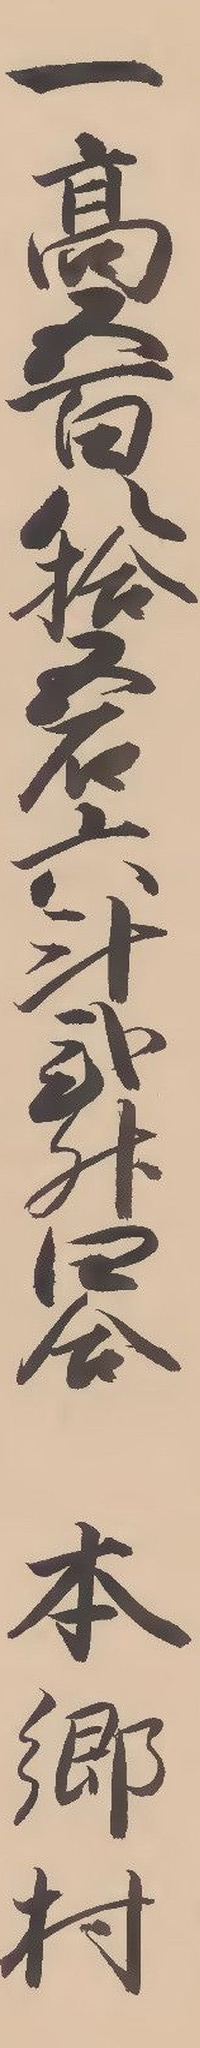一高五百八拾五石六斗弐升四合本郷村
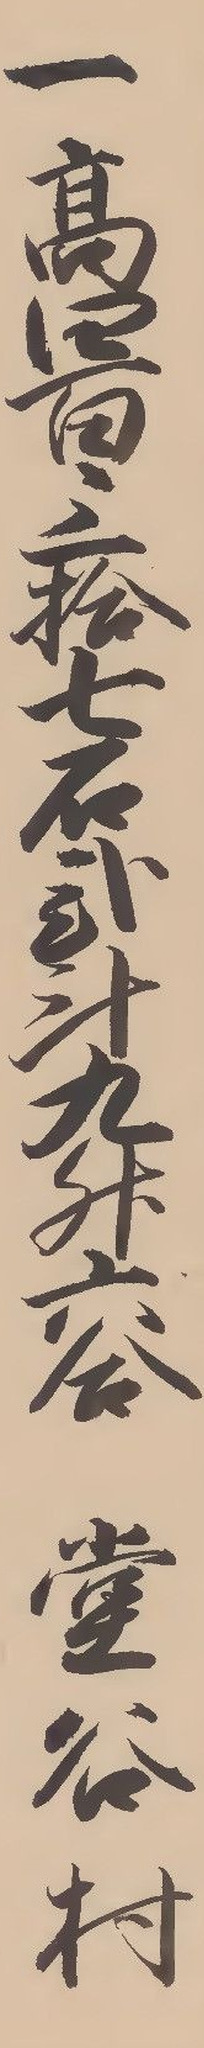一高四百三拾七石弐斗九升六合堂谷村
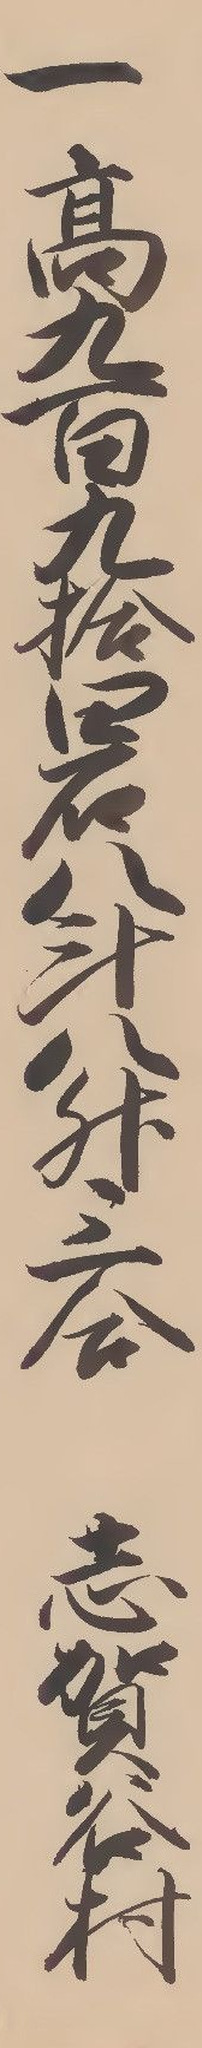一高九百九拾四石八斗八升三合志賀谷村
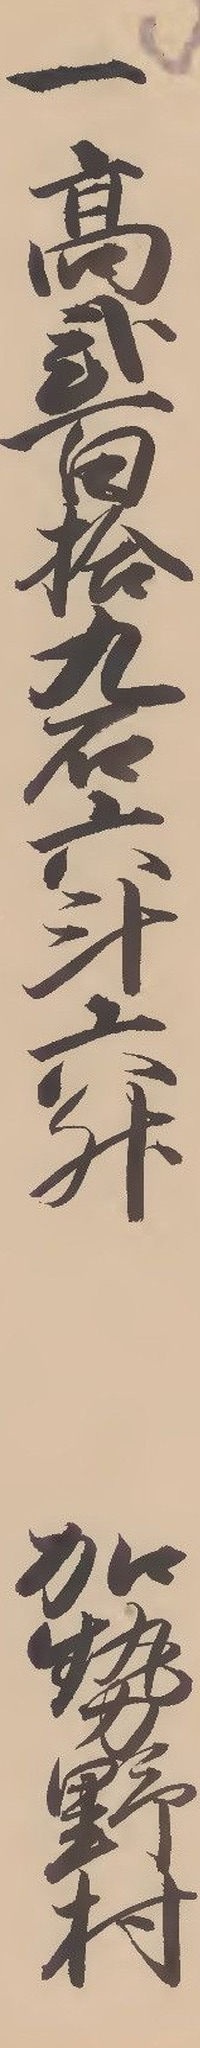一高弐百拾九石六斗六升加勢野村
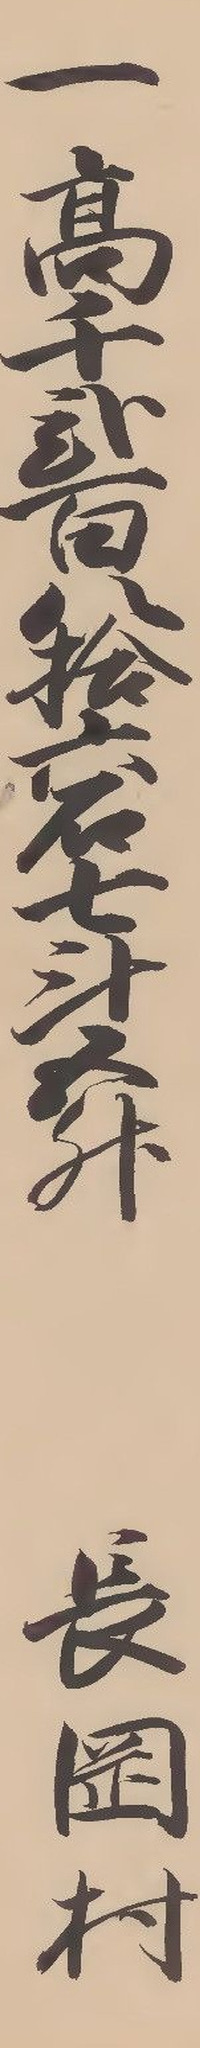一高千弐百八拾六石七斗五升長岡村

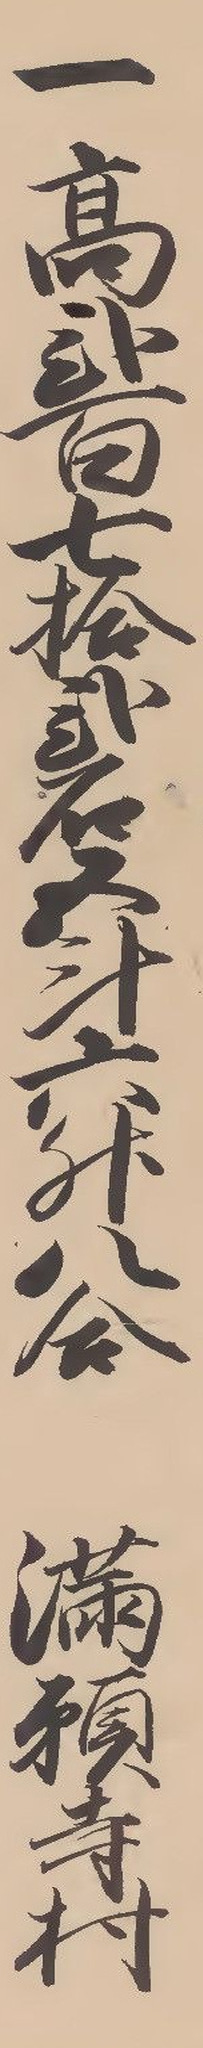一高弐百七拾弐石五斗六升八合満願寺村
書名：近江国郷帳
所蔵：国立公文書館 National Archives of Japan
